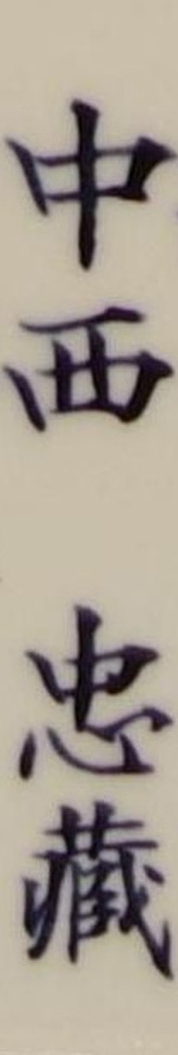中西忠蔵
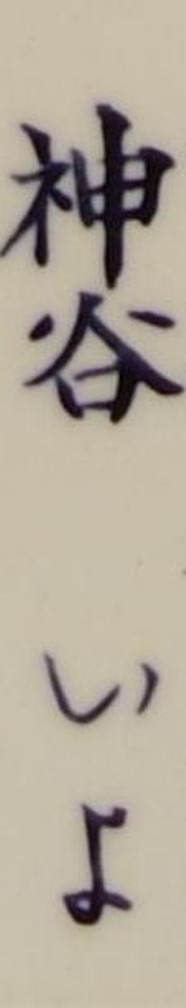神谷いよ
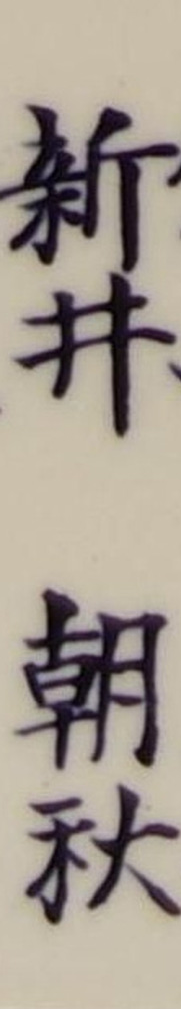新井朝秋
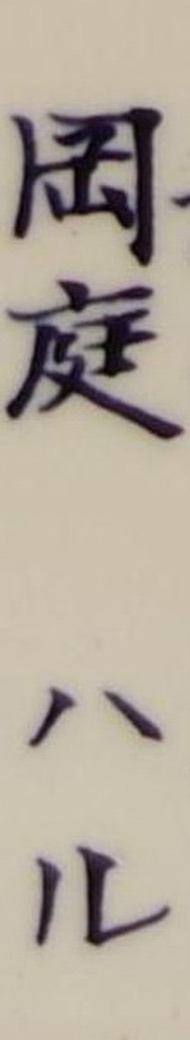岡庭ハル
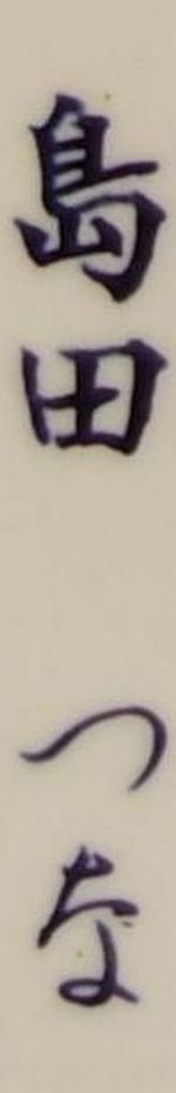島田つな
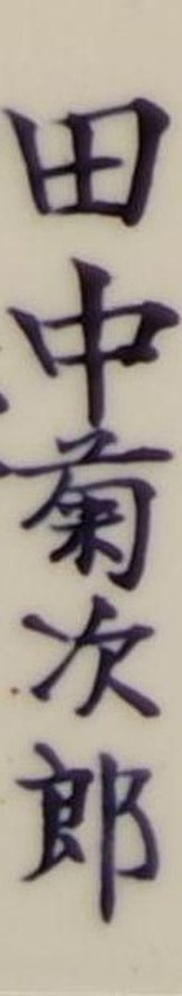田中菊次郎
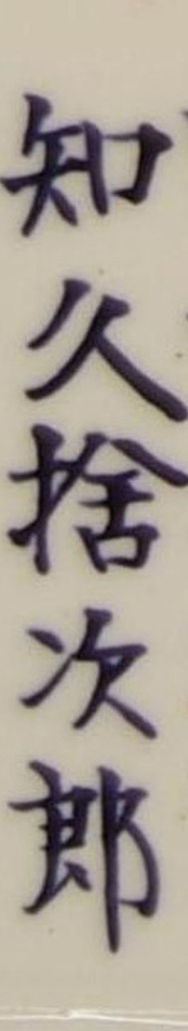知久捨次郎
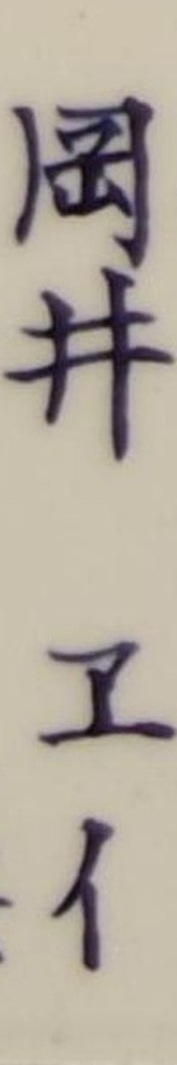岡井ヱイ
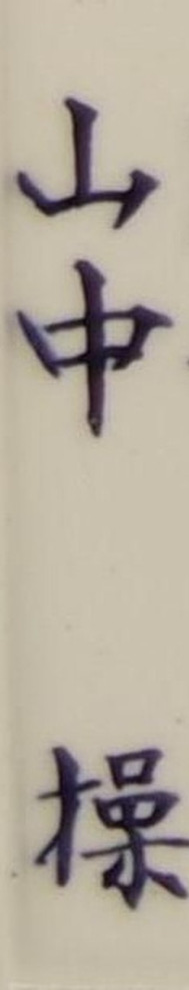山中操

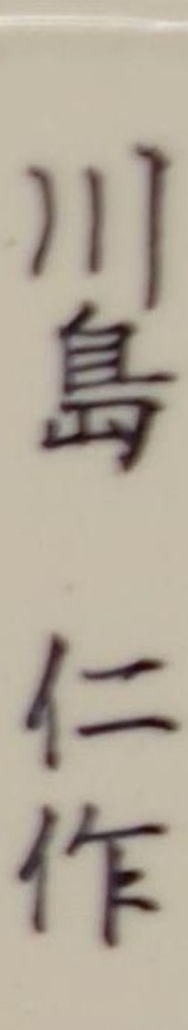川島仁作
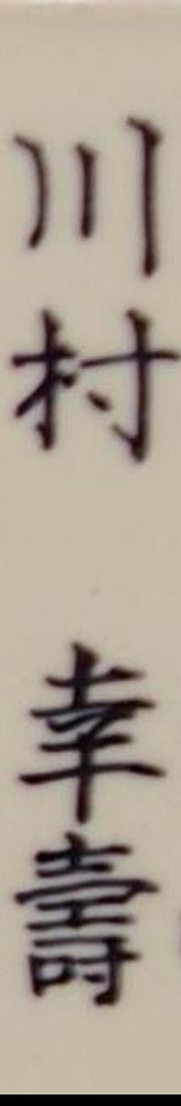川村幸壽
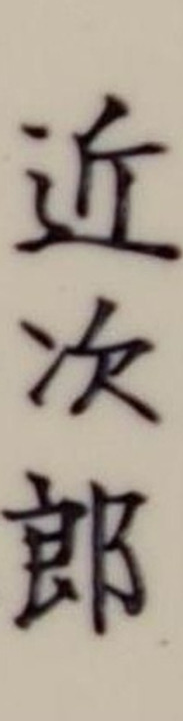近次郎
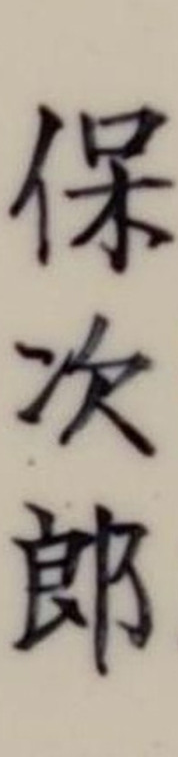保次郎
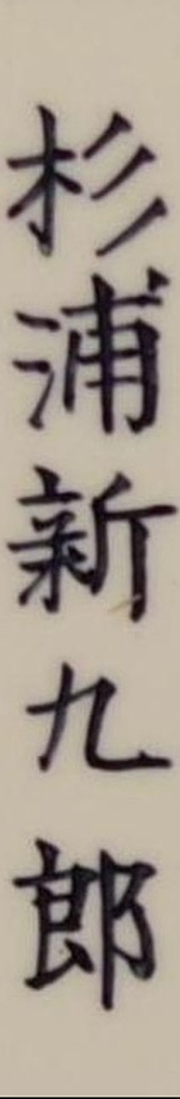杉浦新九郎
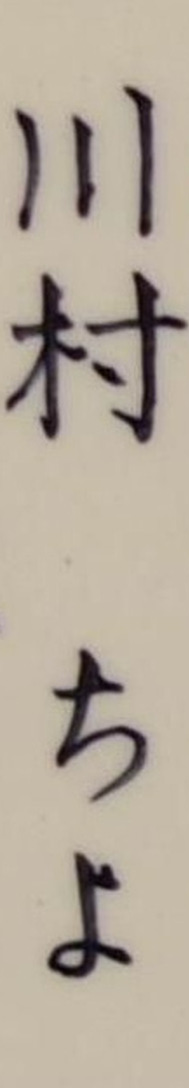川村ちよ
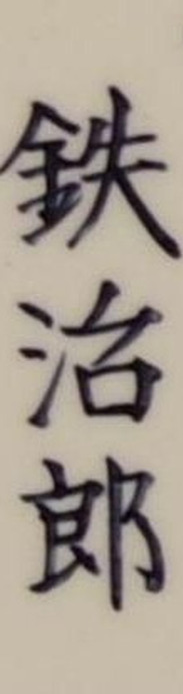鉄治郎
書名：M~S
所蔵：高野山金剛峯寺
